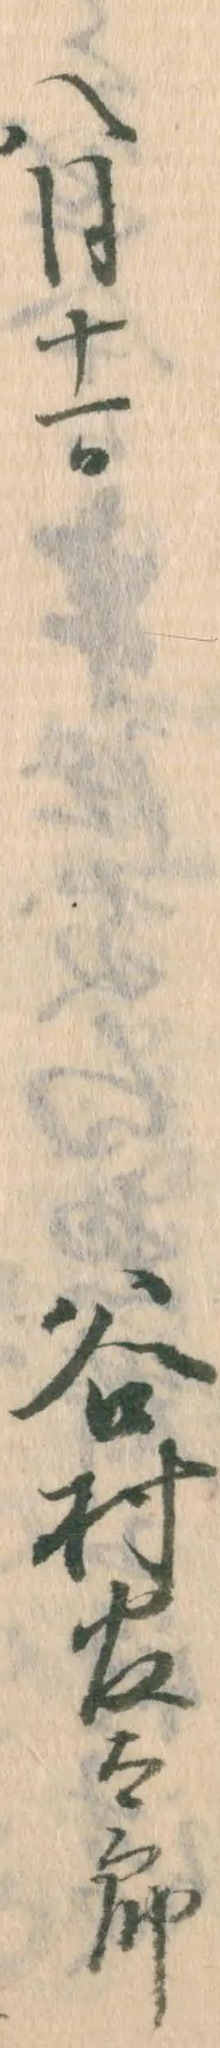八月十一日谷村官太郎
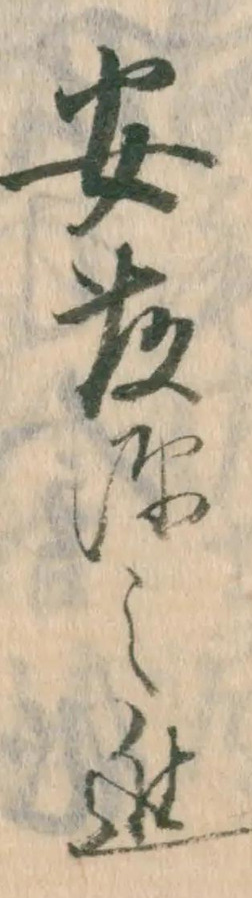安藤源之進
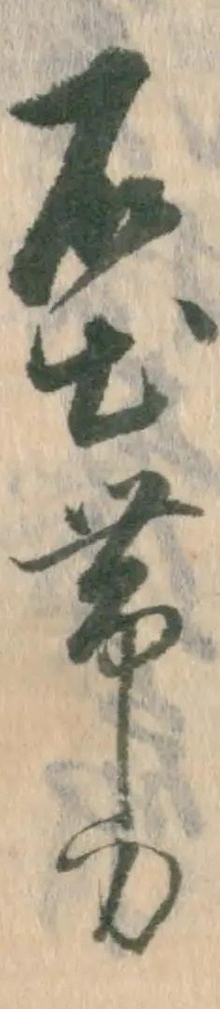石出帯刀
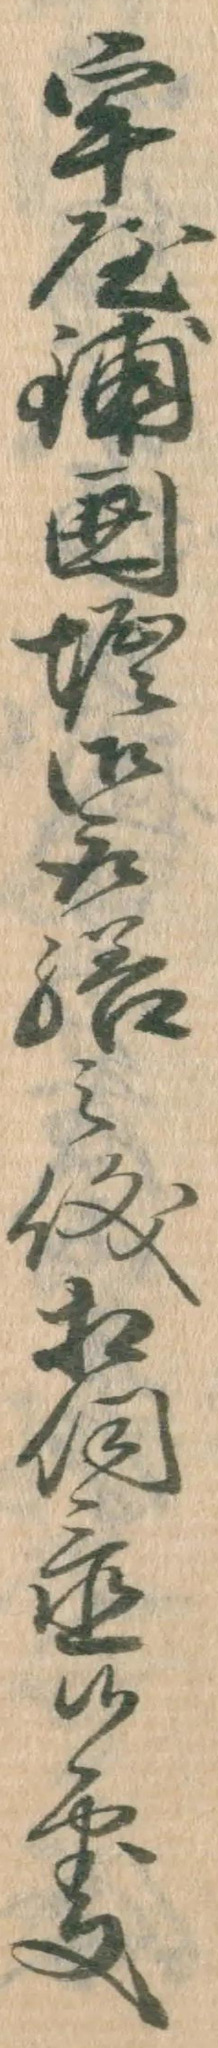牢屋鋪囲堀御取繕之儀相伺置候処
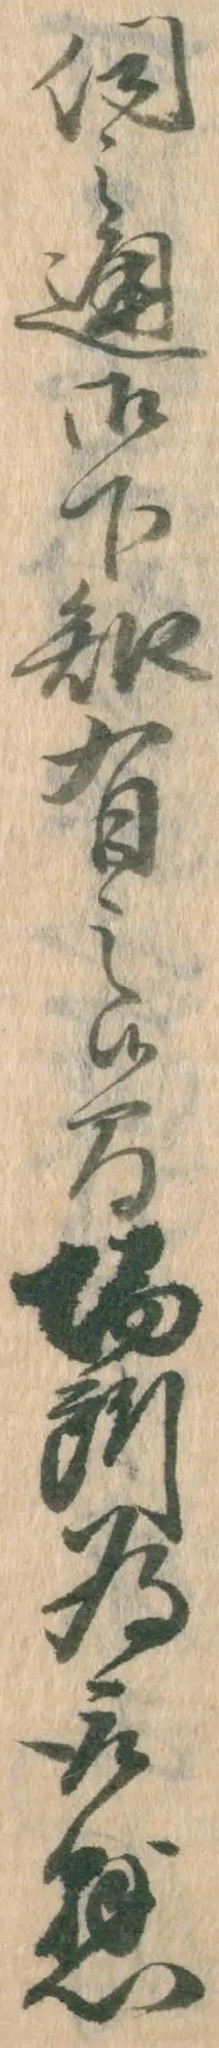伺之通御下知有之候間場所為取懸

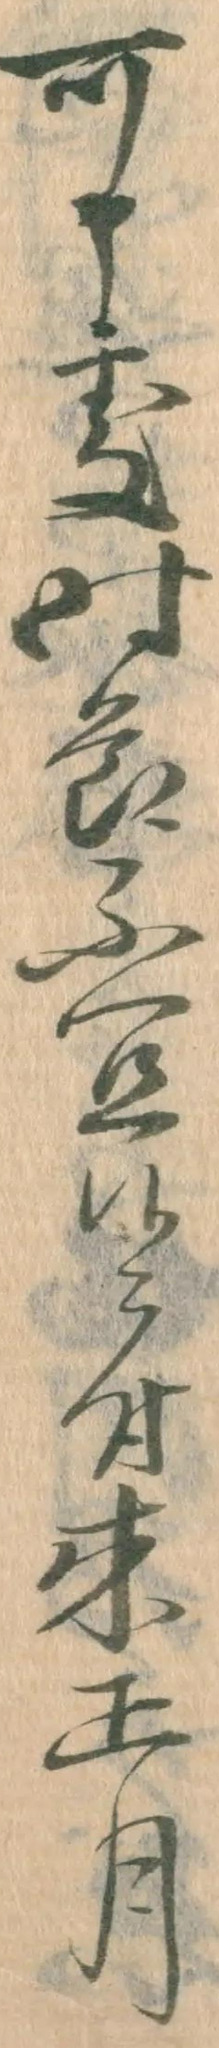可申処時節不宜候ニ付来正月
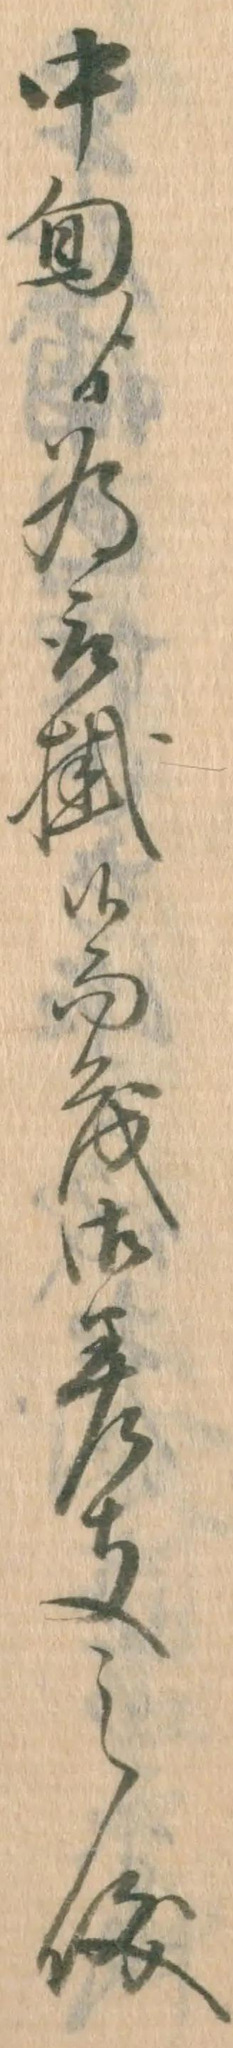中旬ゟ為取掛候ても御差支之儀
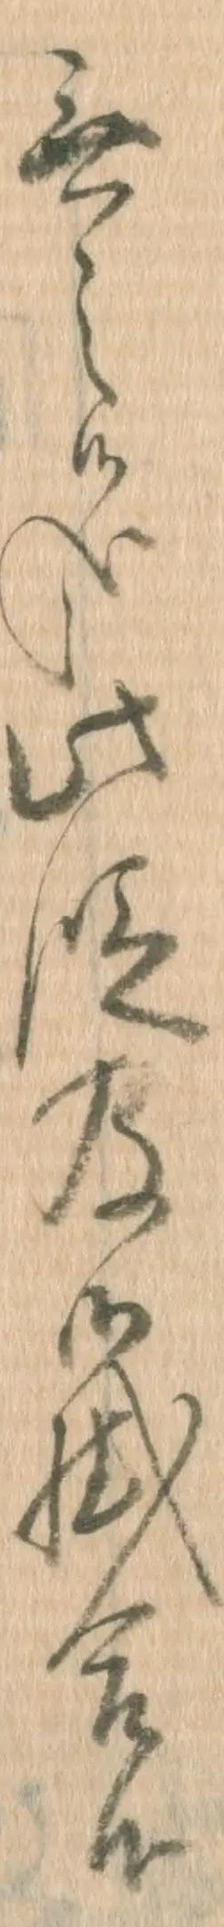無之候哉此段及御掛合候
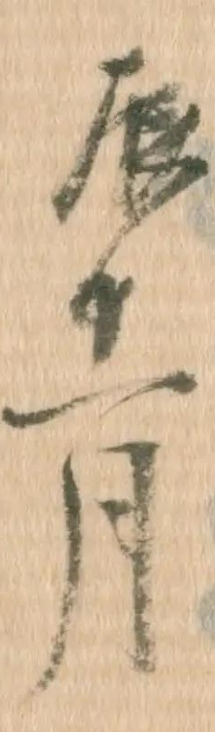辰十一月
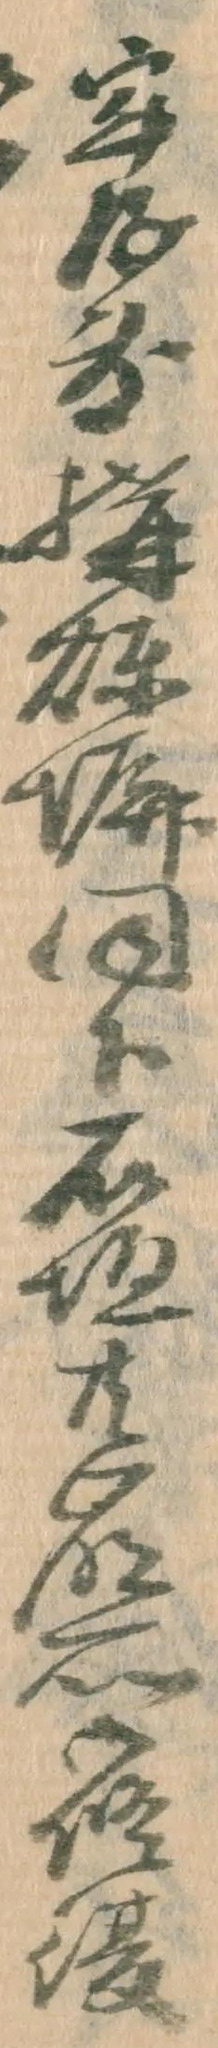│牢屋敷構煉塀同下石垣共崩所御修復
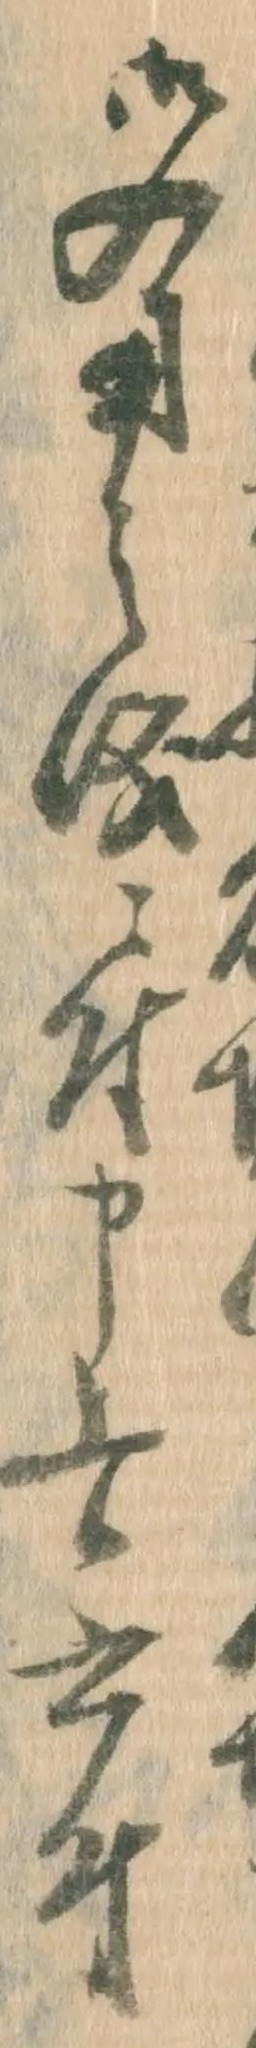│御入用之儀ニ付申上候書付
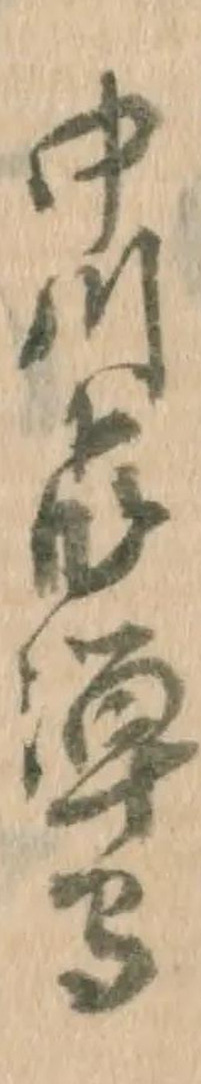│中川飛騨守
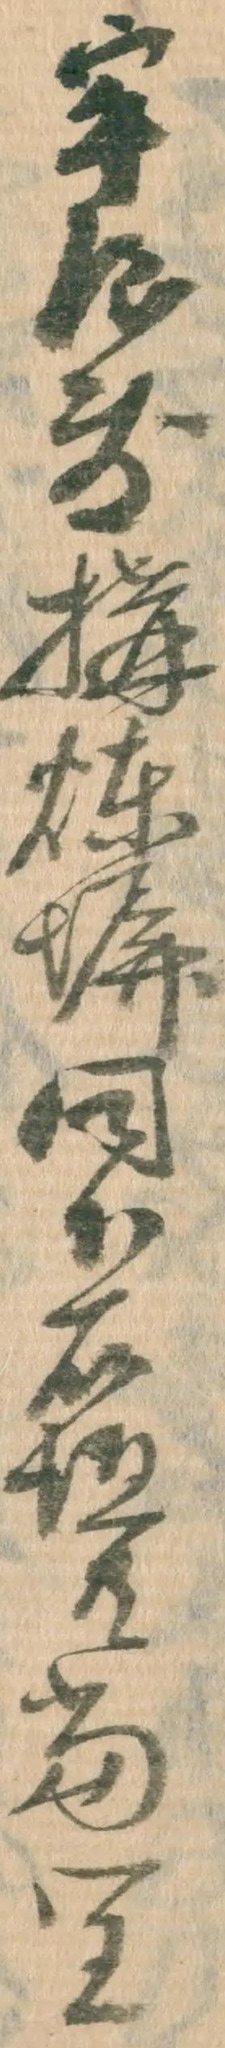牢屋敷構煉塀同下石垣共当閏
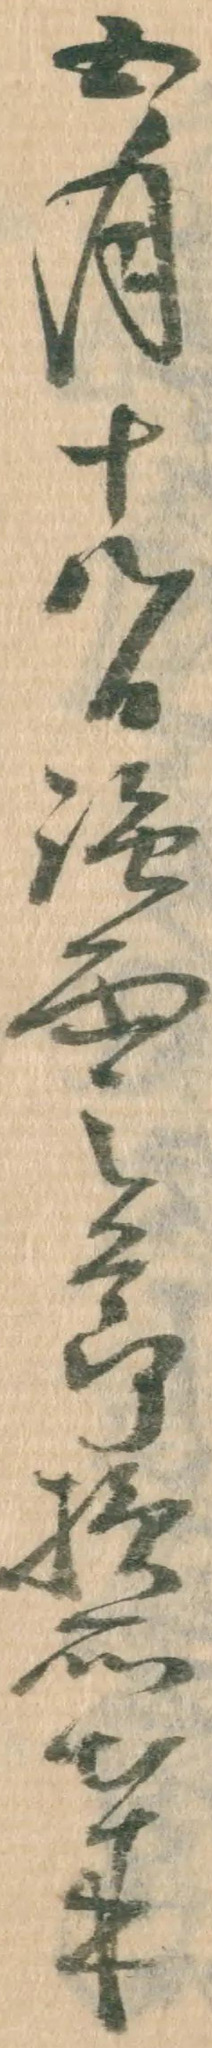五月十八日強雨之節損所出来
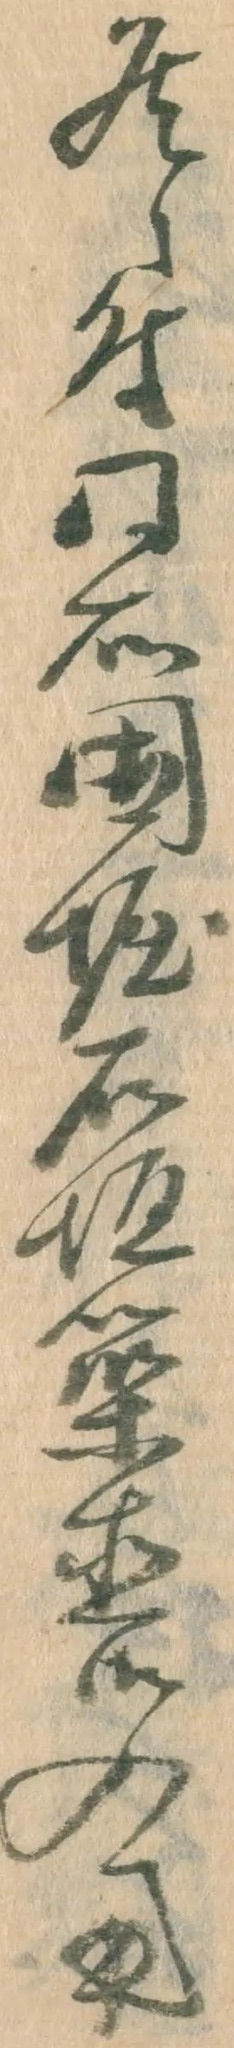居候付同所囲堀石垣築直御入用

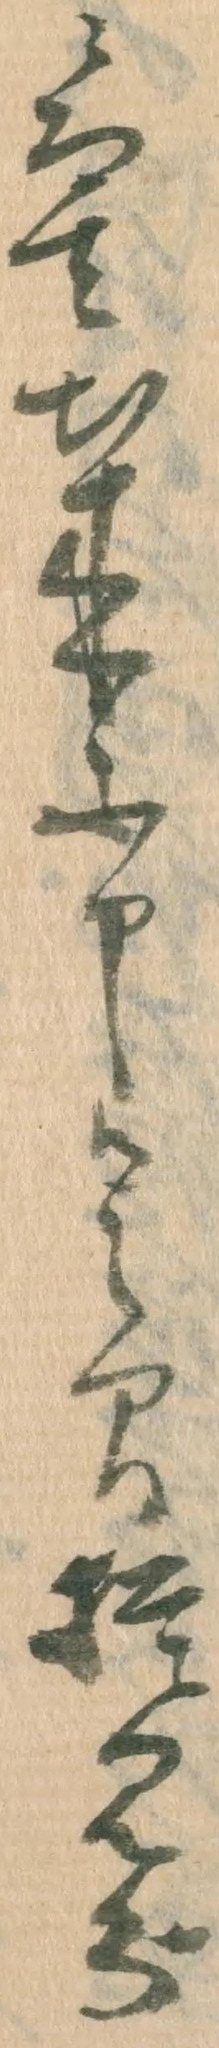ニては出来不申候之間猶見分
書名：七十冊物類集 71巻. [44] 四十三 牢屋敷御普請御修覆地震ニ付骨折候牢屋掛御褒美之部
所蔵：国立国会図書館 National Diet Library, JAPAN
